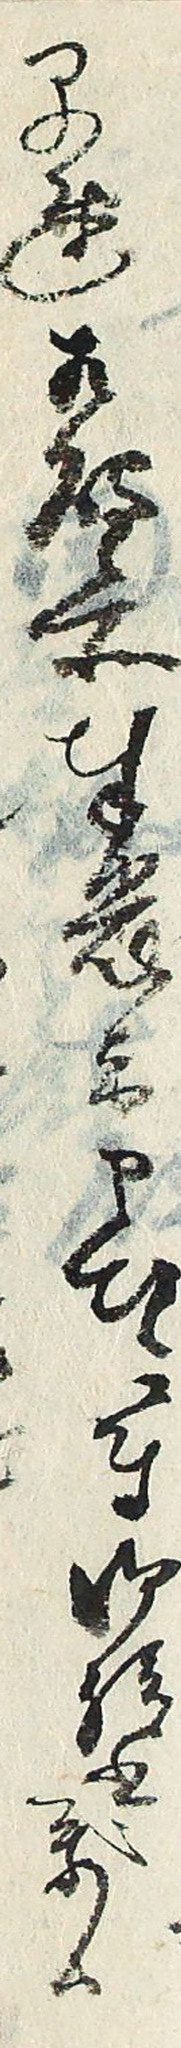早速相触候所奉畏旨申出候に付御請書之義は
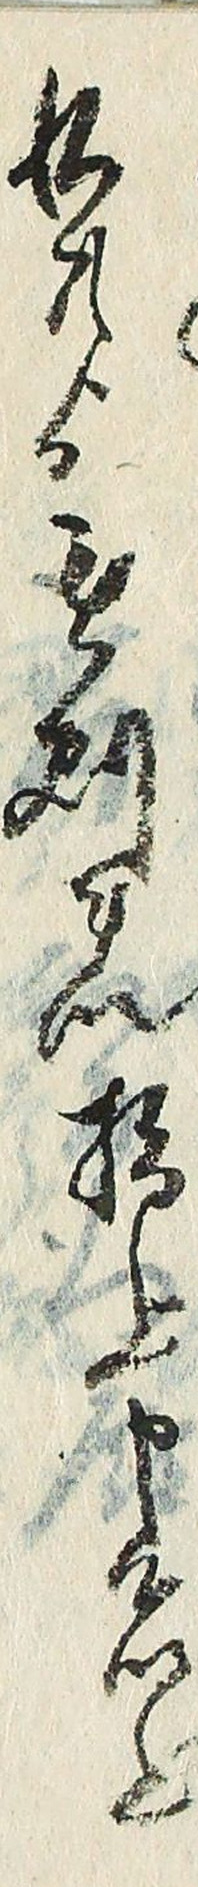私共ゟ連判を以指上申候以上
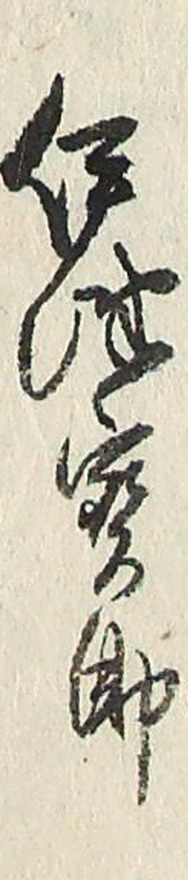伊澤宝助
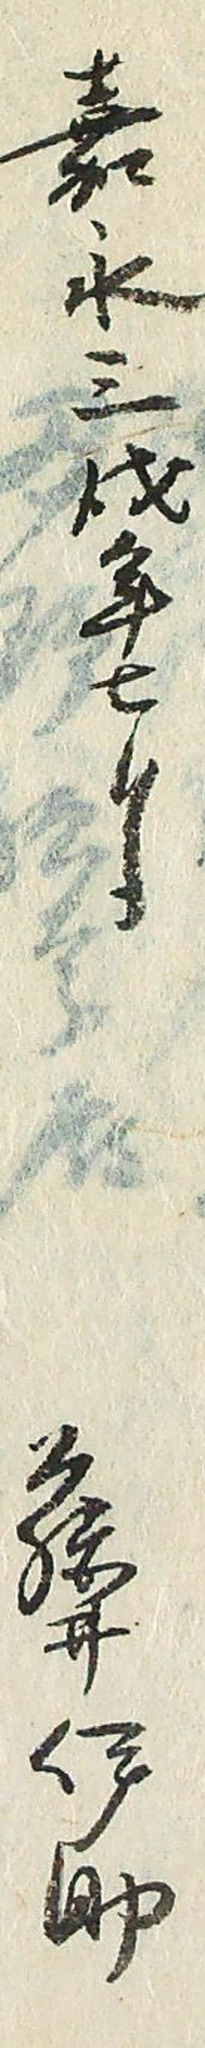嘉永三戌年七月藤井伊助
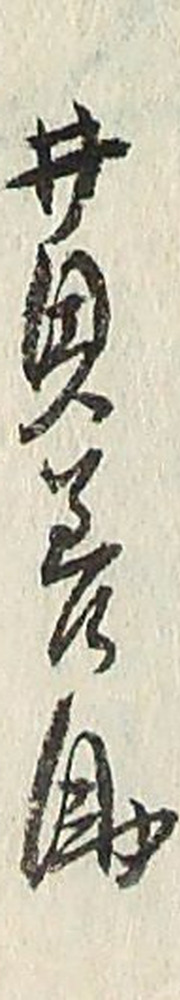井貝善助
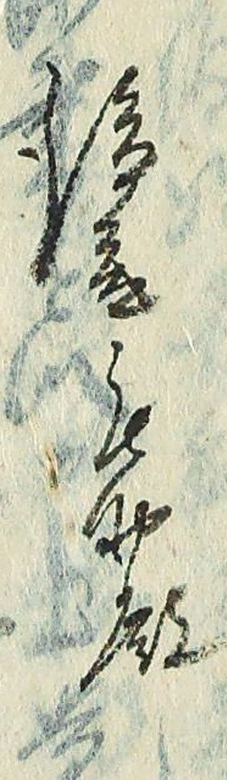後藤庄助殿
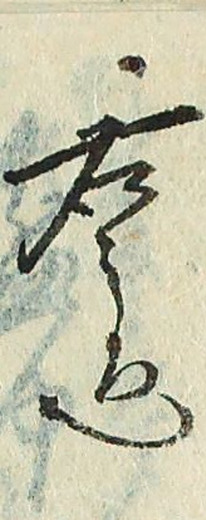右之通
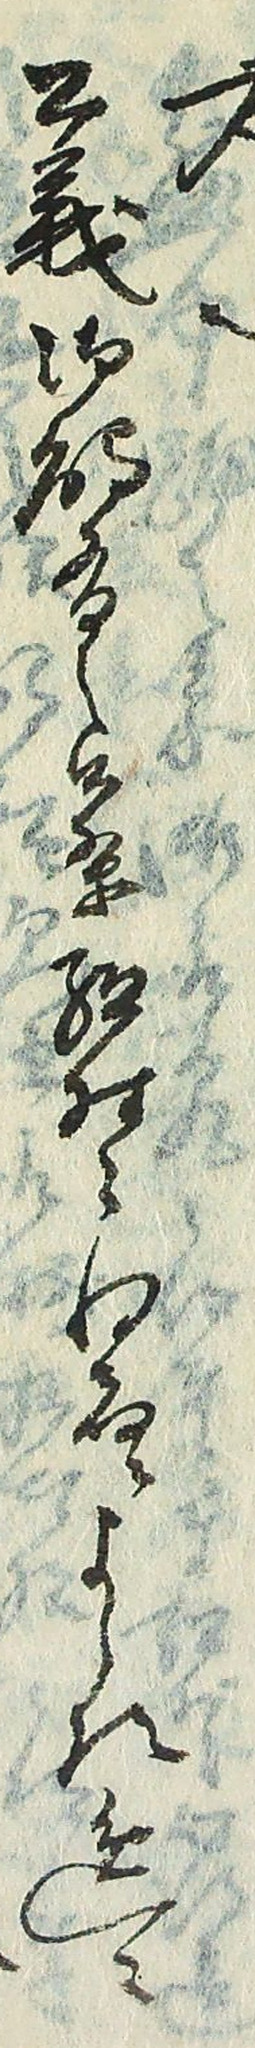公義御触有之候条組村々何者によらす逸々
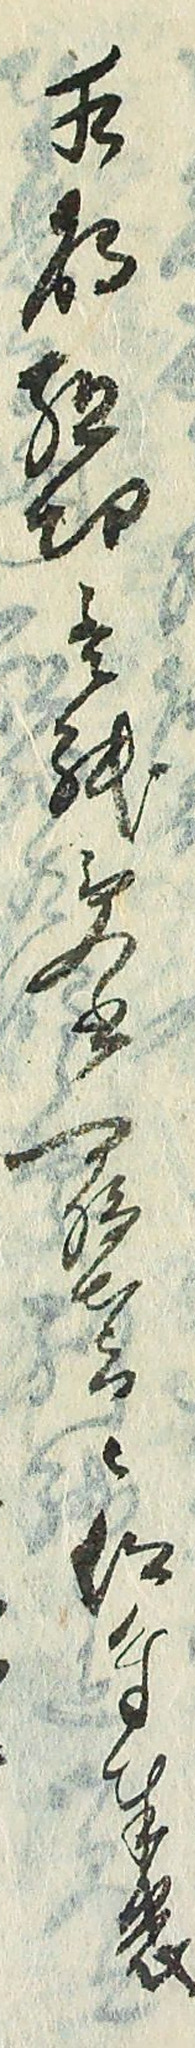相触組切壱紙受書可指出旨被仰付奉畏
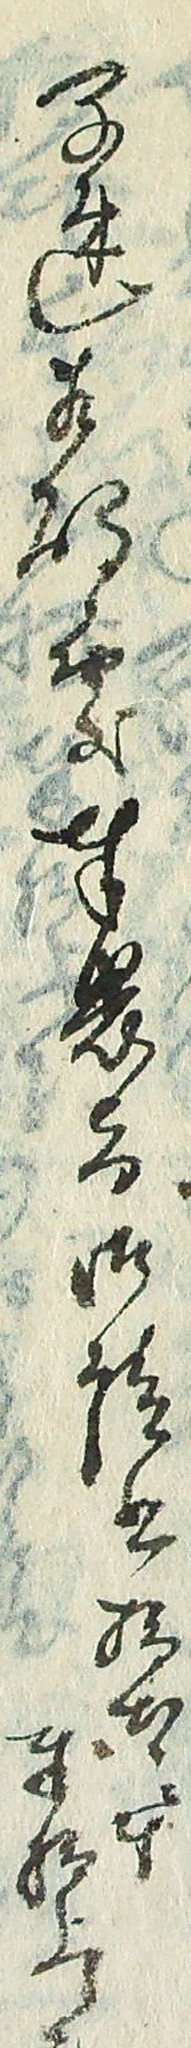早速相触候処奉畏旨御請書指出候に付
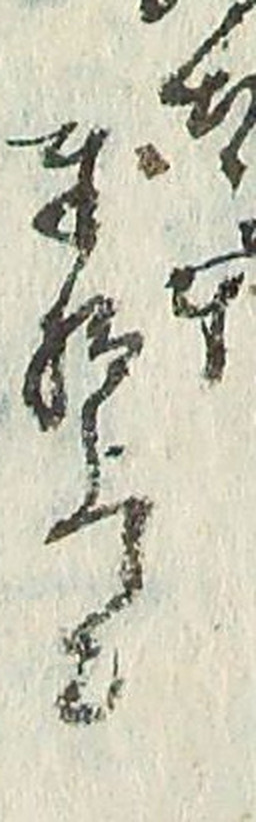奉指上候以上
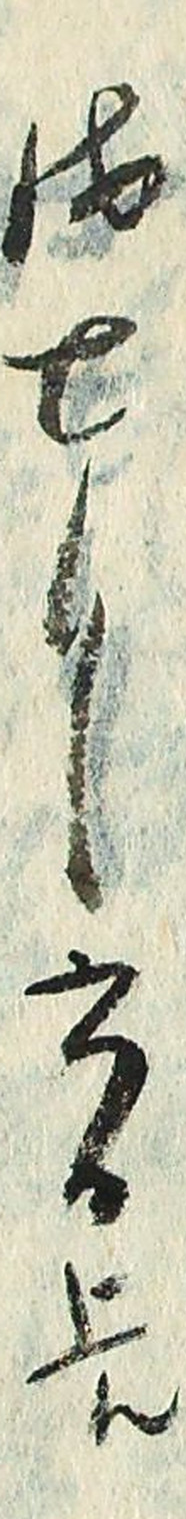戌七月六日上ル
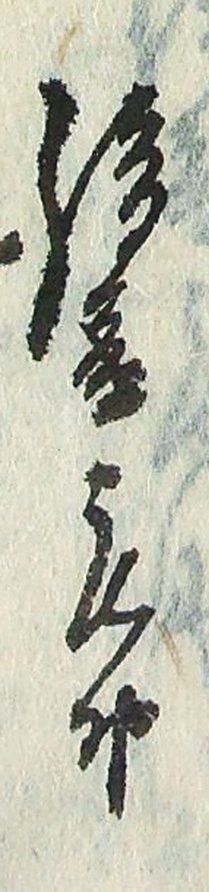後藤庄助
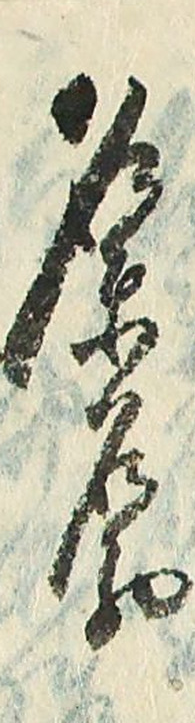名東名西

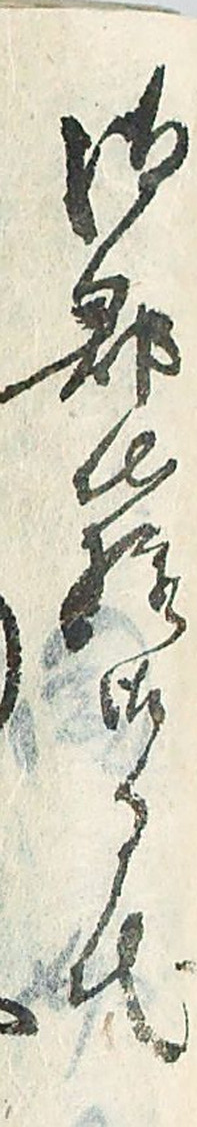御郡代様御手代
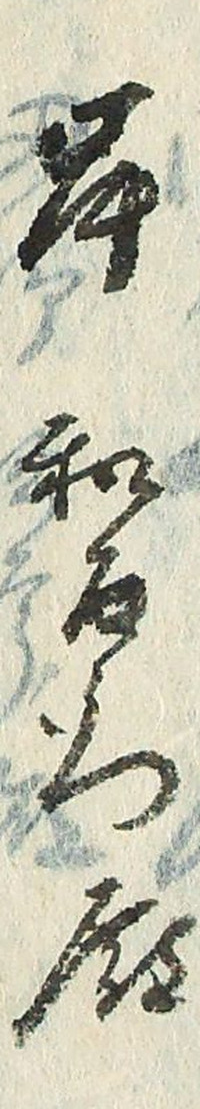岸和左衛門殿
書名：諸御用御□受書控
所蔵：鳴門教育大学 Naruto University of Education
